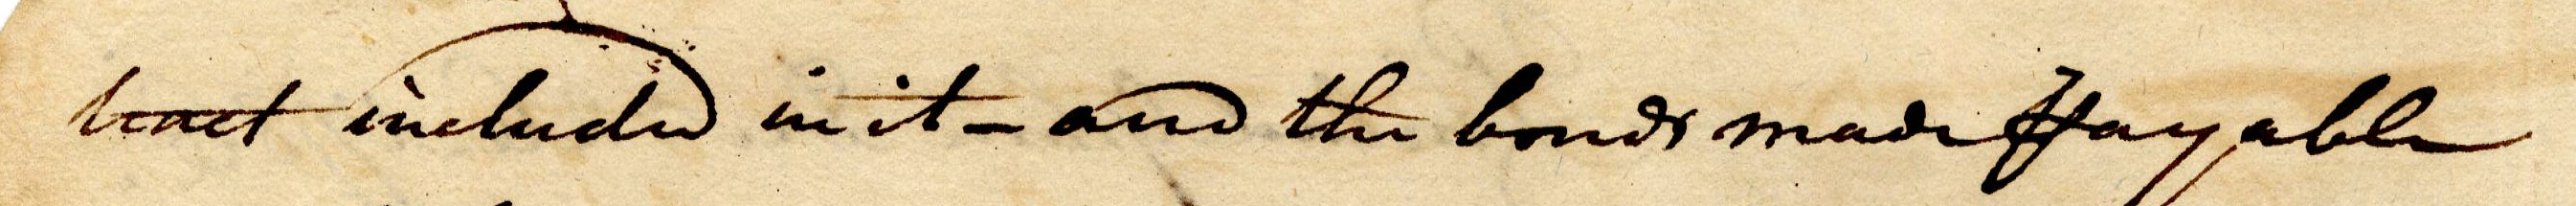tract included in it- and the bonds made payable
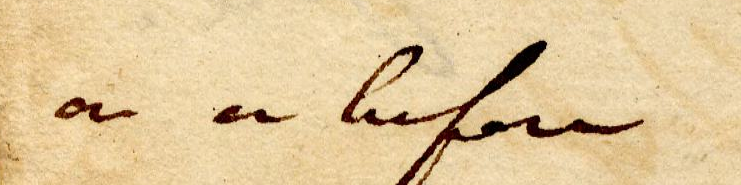or as before
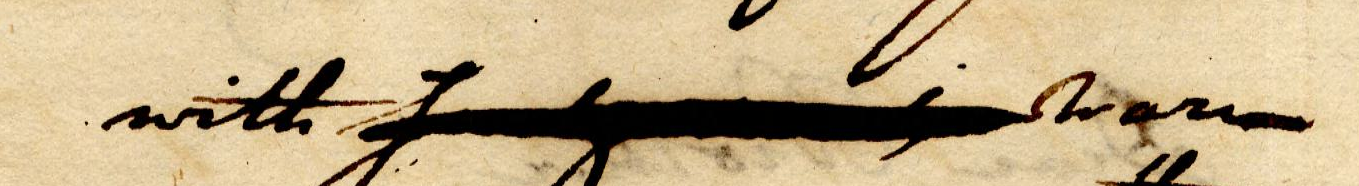with [________] warr
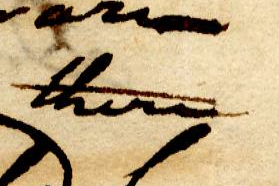there
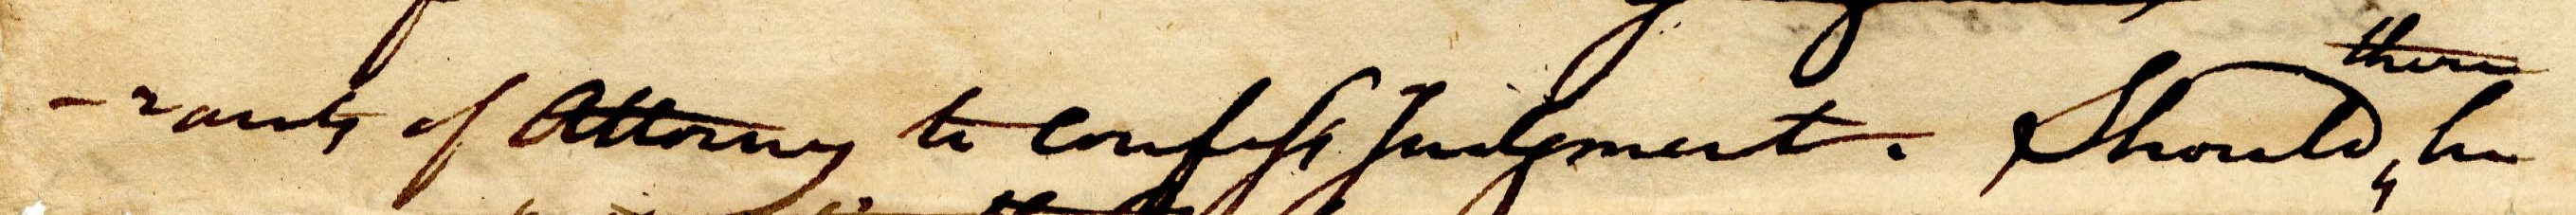-rants of attorney to judgment. Should ^ be
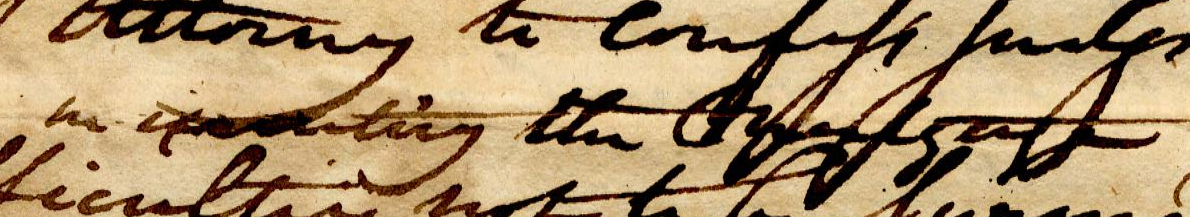in exacting the mortgage
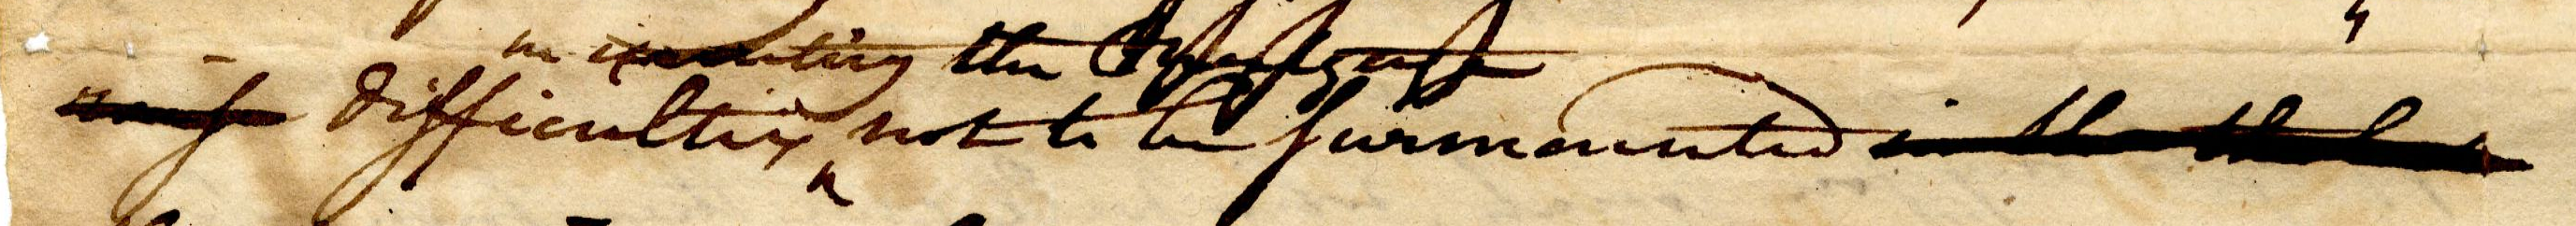[raise] difficulty ^ not to be surmounted [___________]
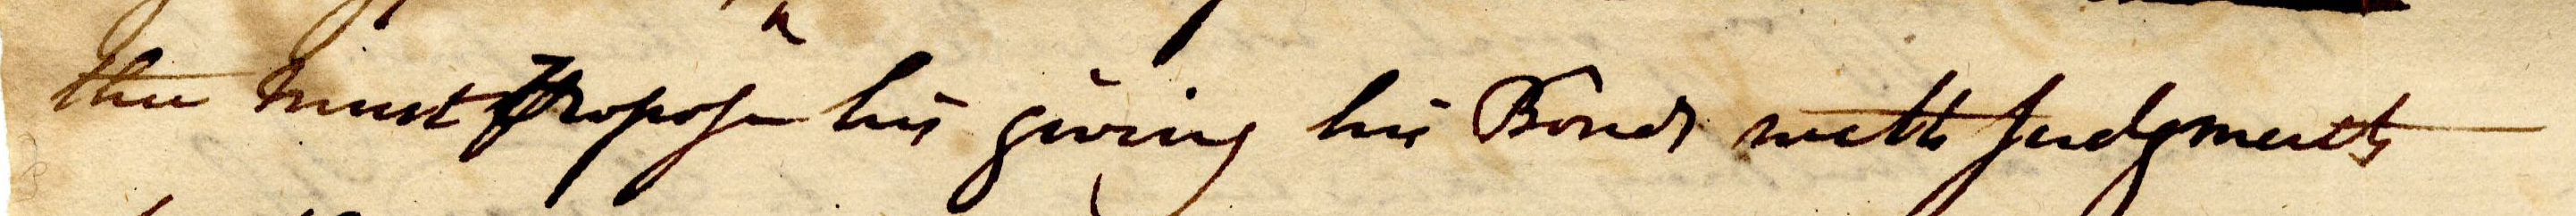thee must propose his giving his Bonds with judgment
